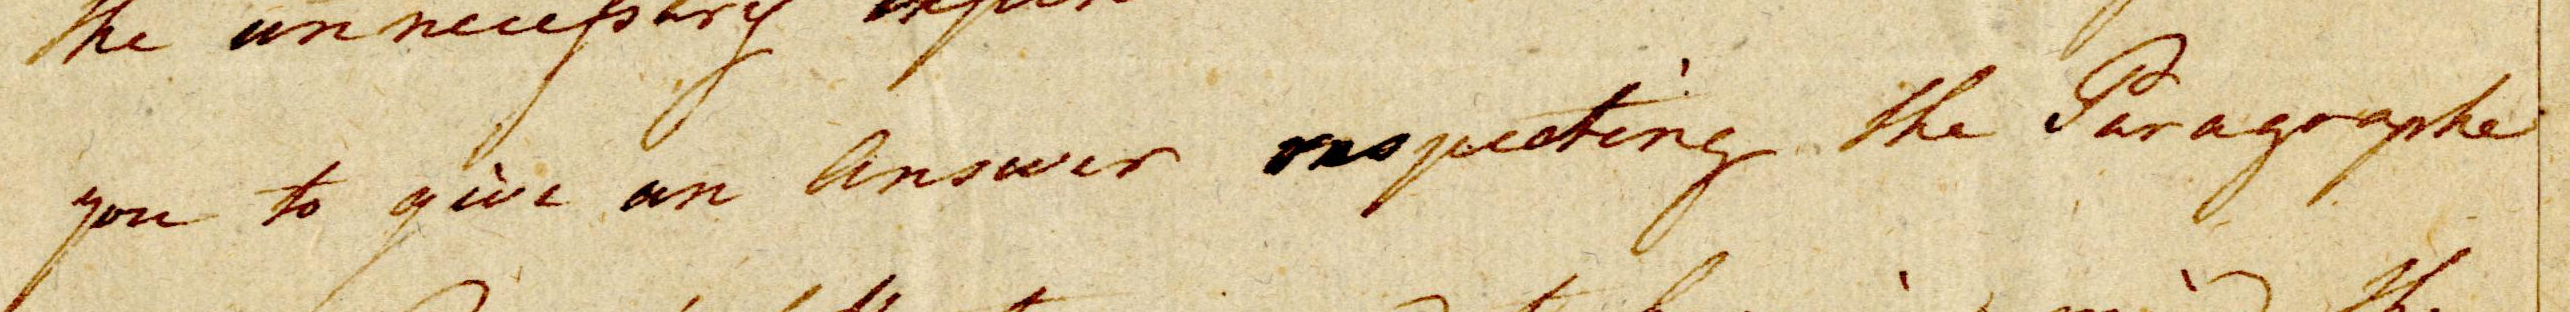you to give an Answer respecting the Paragraphe
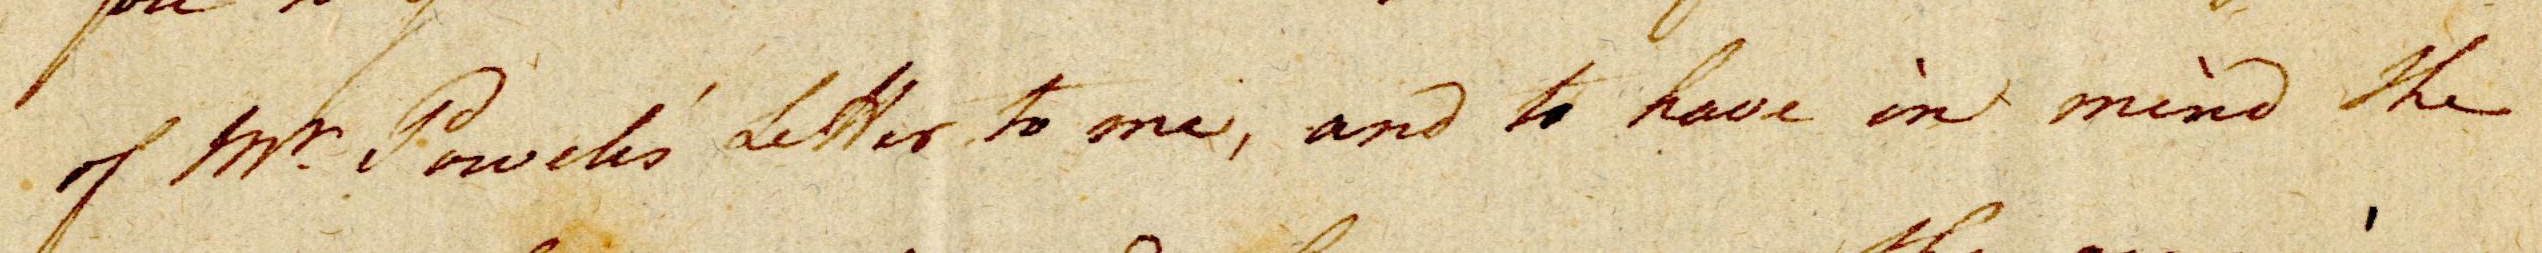of M^r. Poweles Letter to me, and to have in mind the
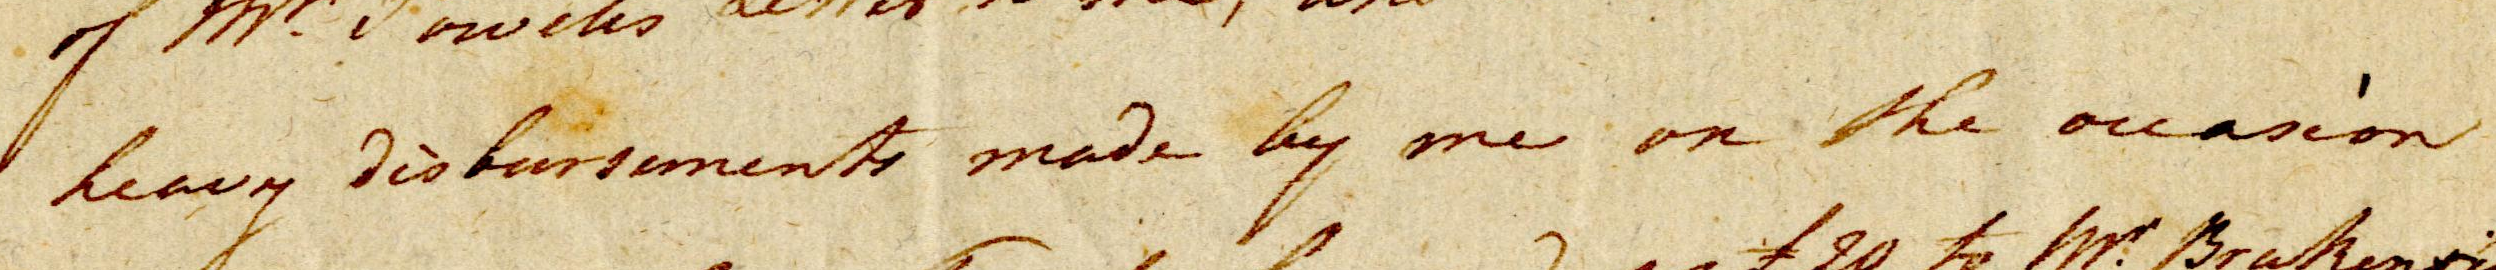heavy disbursements made by me on the occasion
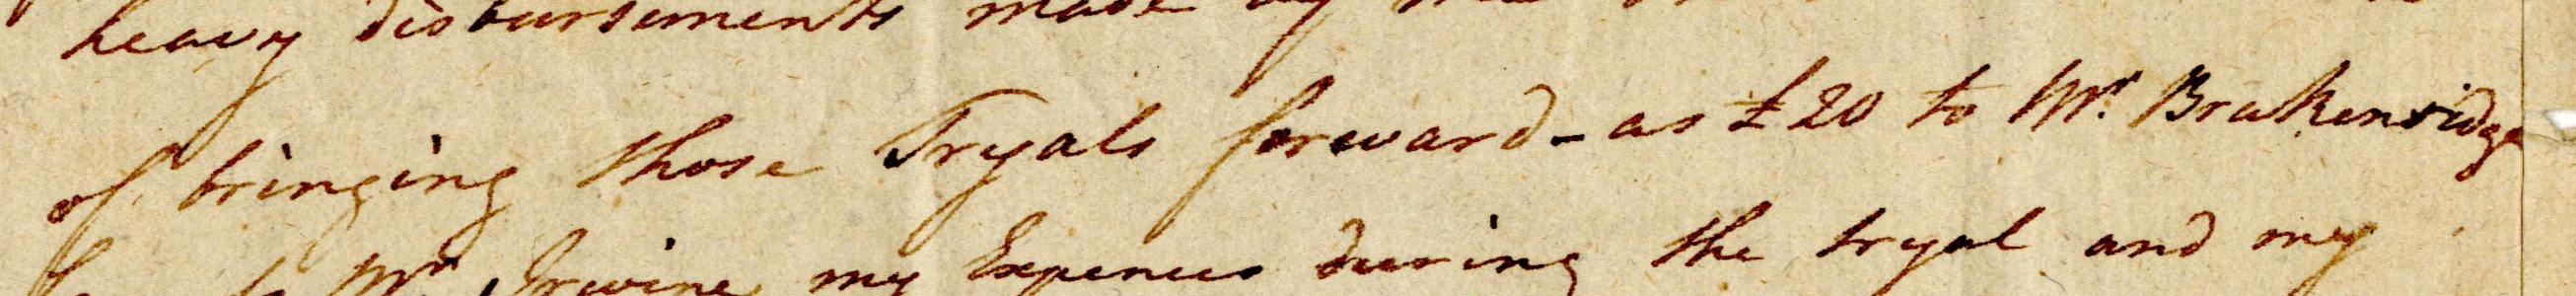of bringing those Tryals forward- as £20 to M^r. Brakenridge
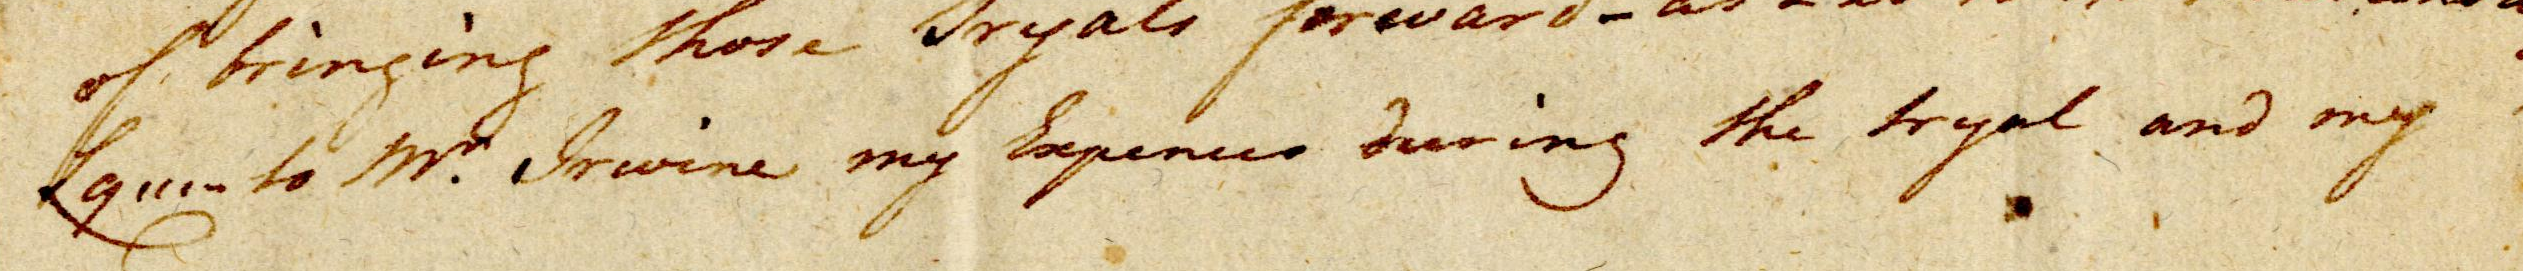£9.... to M^rs. Frewine my Expenses during the tryal and my
